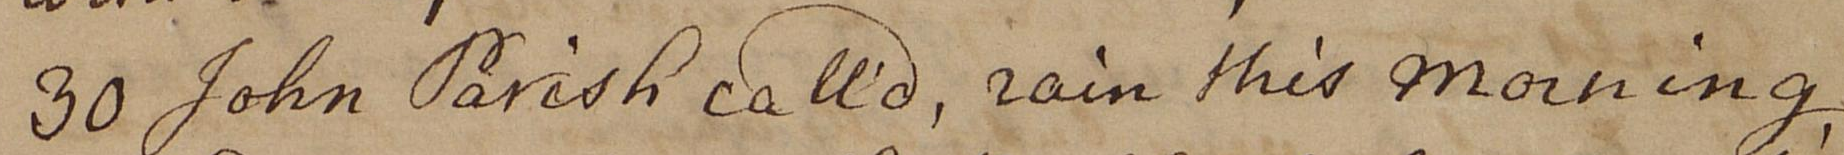30 John Parish call'd, rain this morning,
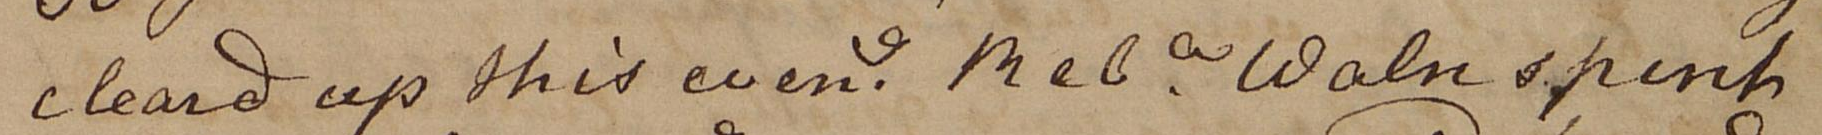cleard up this even^g. Reb^a. Waln spent
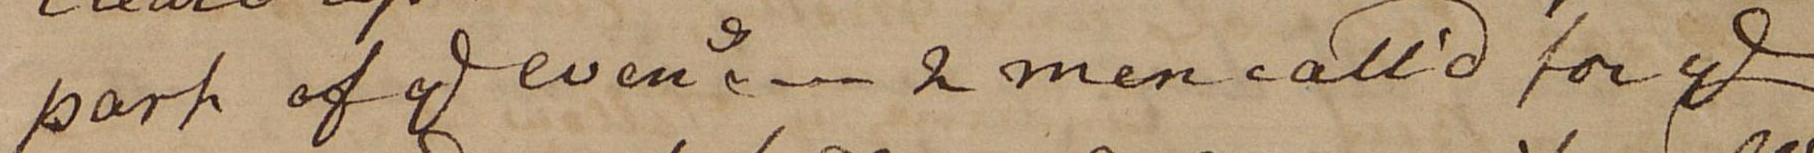part of y^e even^g.- 2 men call'd for y^e
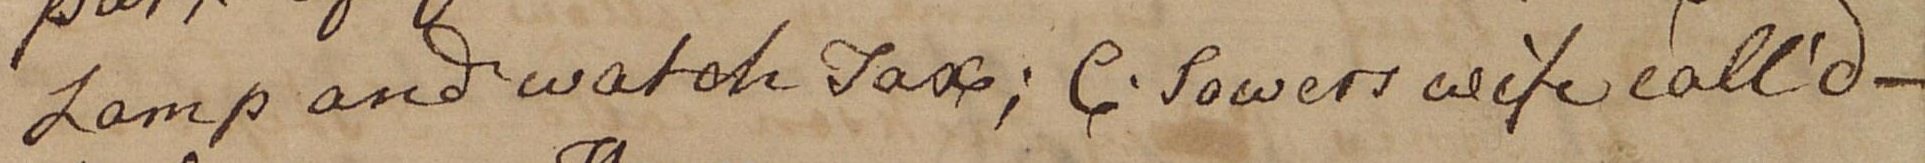Lamp and watch Tax; C. Sowers wife call'd-
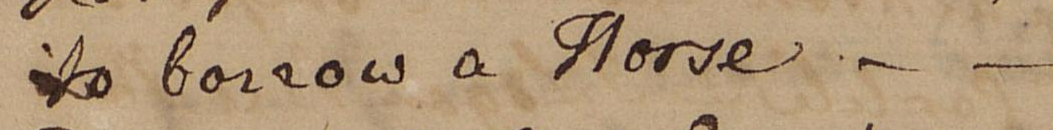to borrow a Horse--
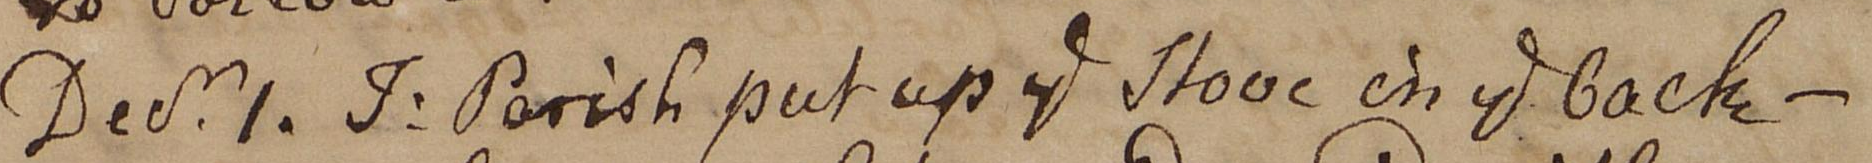Dec^r. 1. I: Parish put up y^e Stove in y^e back-
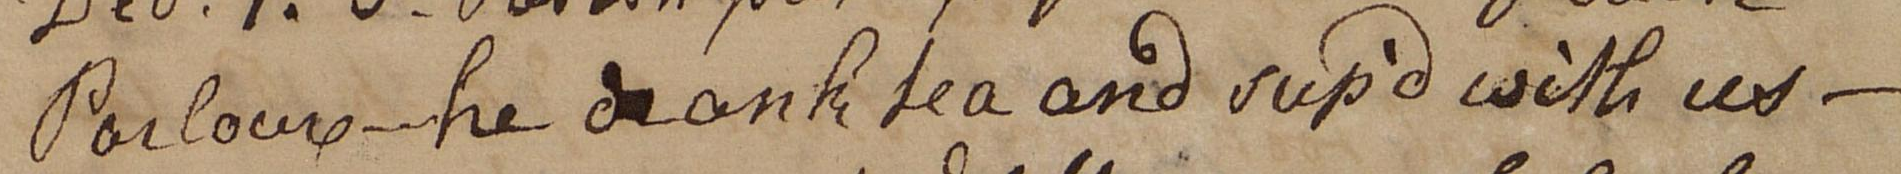Parlour-he drank tea and sup'd with us-
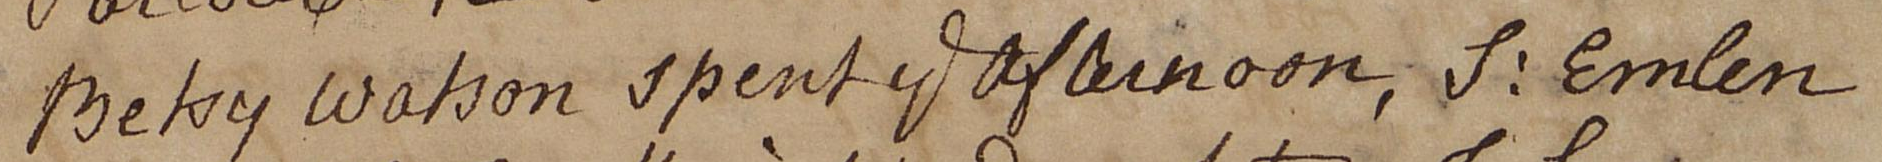Betsy Watson spent y^e Afternoon, S: Emlen
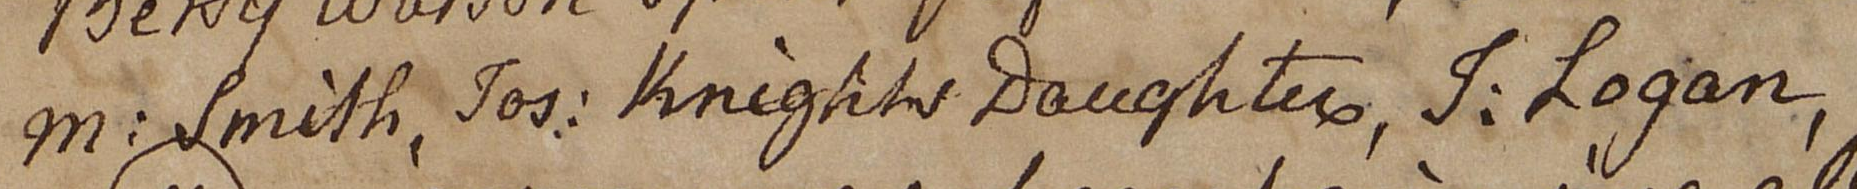M: Smith, Jos: Knights Daughter, S: Logan,
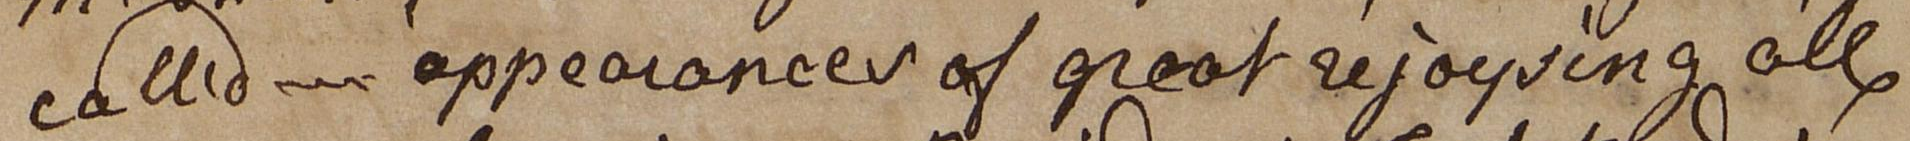call'd- appearances of great rejoysing all
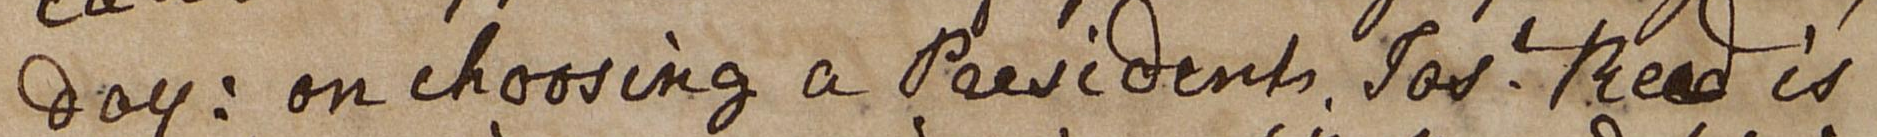day: on choosing a President, Jos^h. Reed is
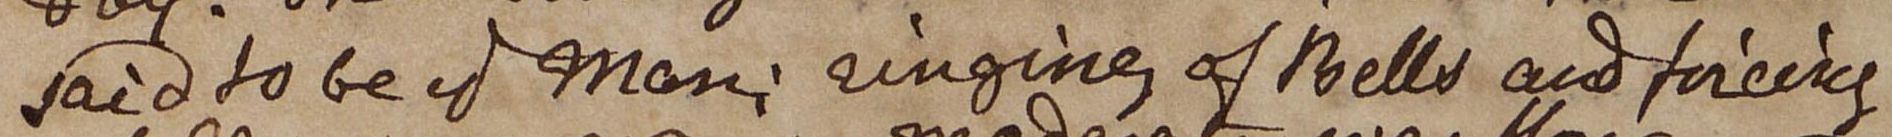said to be y^e Man; ringing of Bells aid fireing
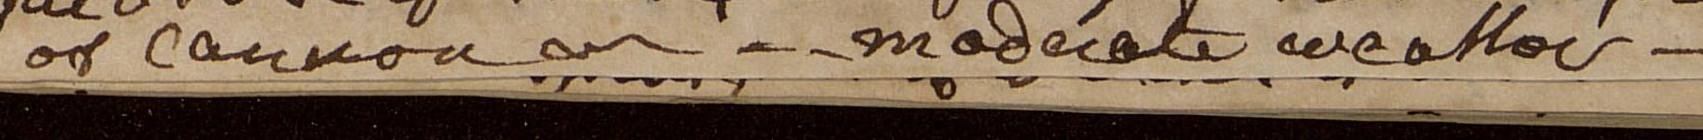of Cannon- moderate weather-
